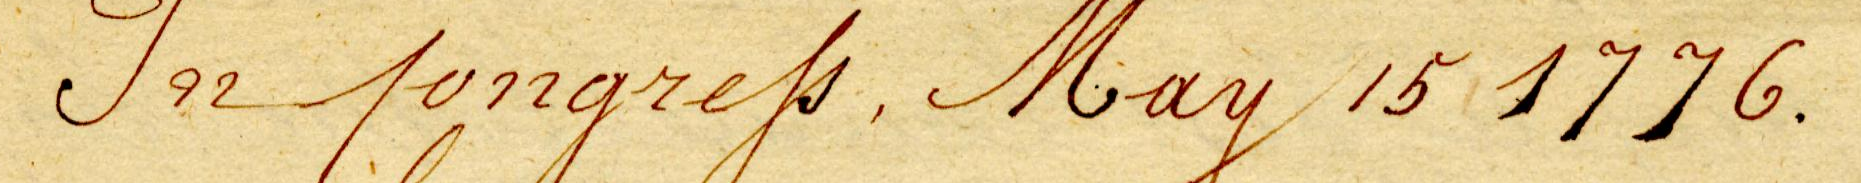In Congress, May 15 1776.
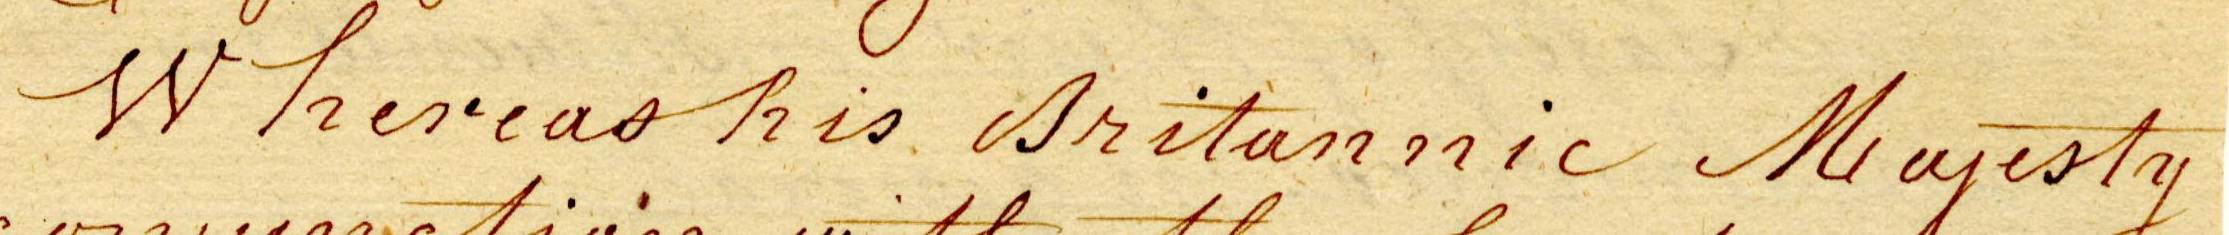Whereas his Britannic Majesty
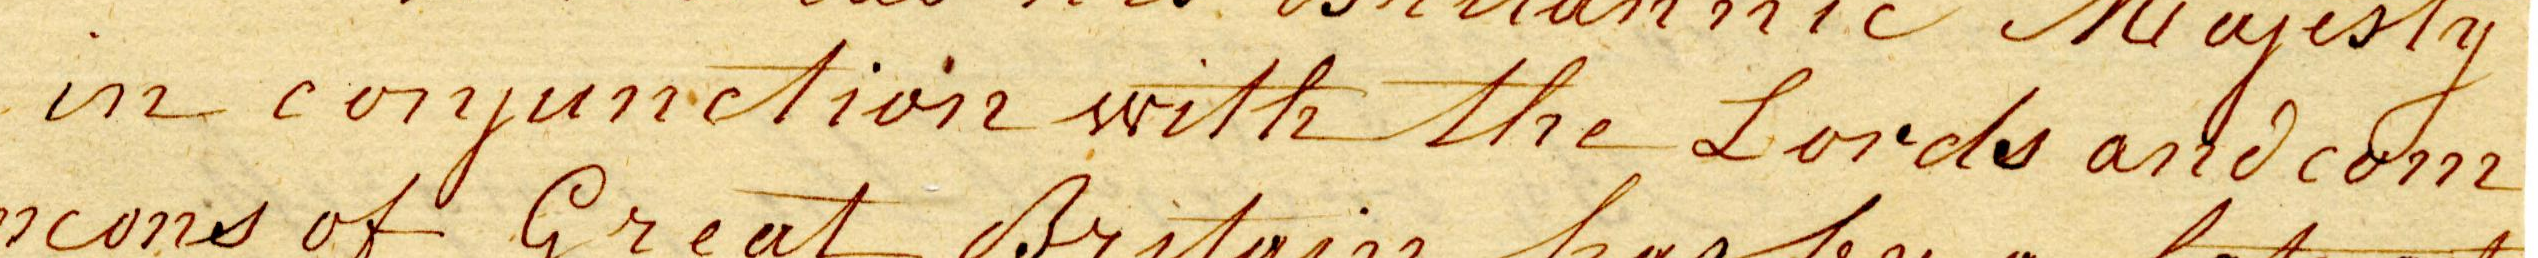in conjunction with the Lords and com
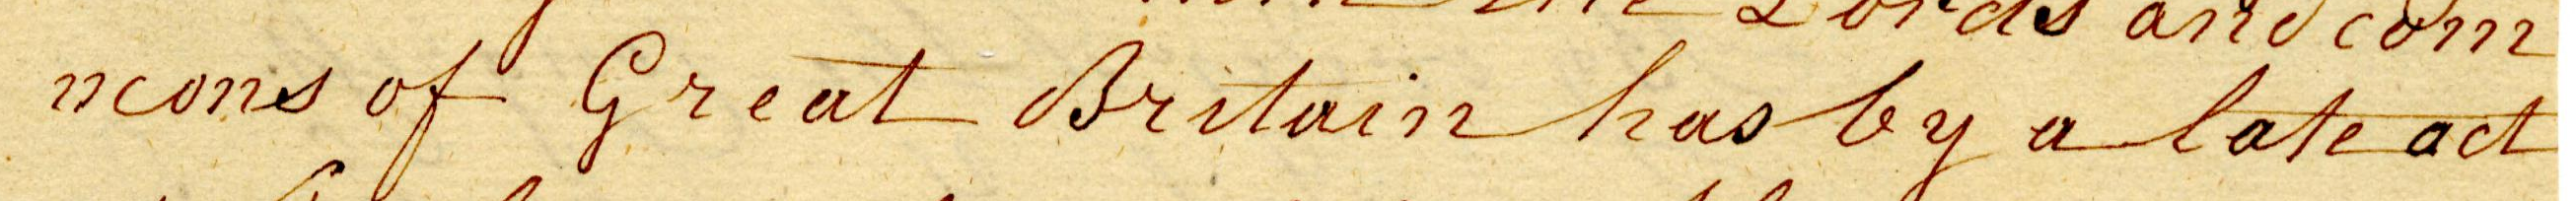mons of Great Britain has by a late act
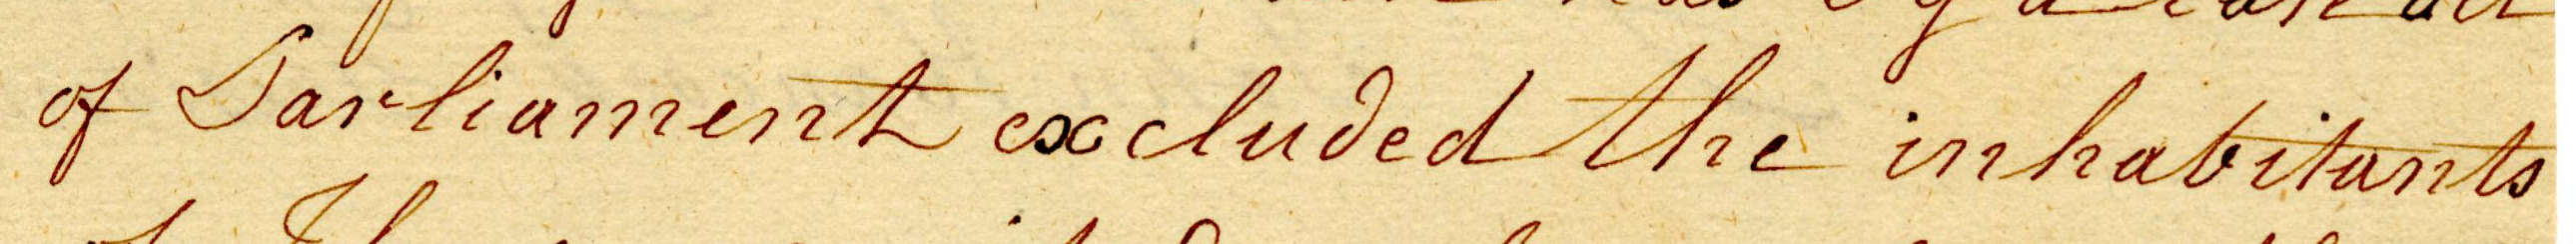of Parliament excluded the inhabitants
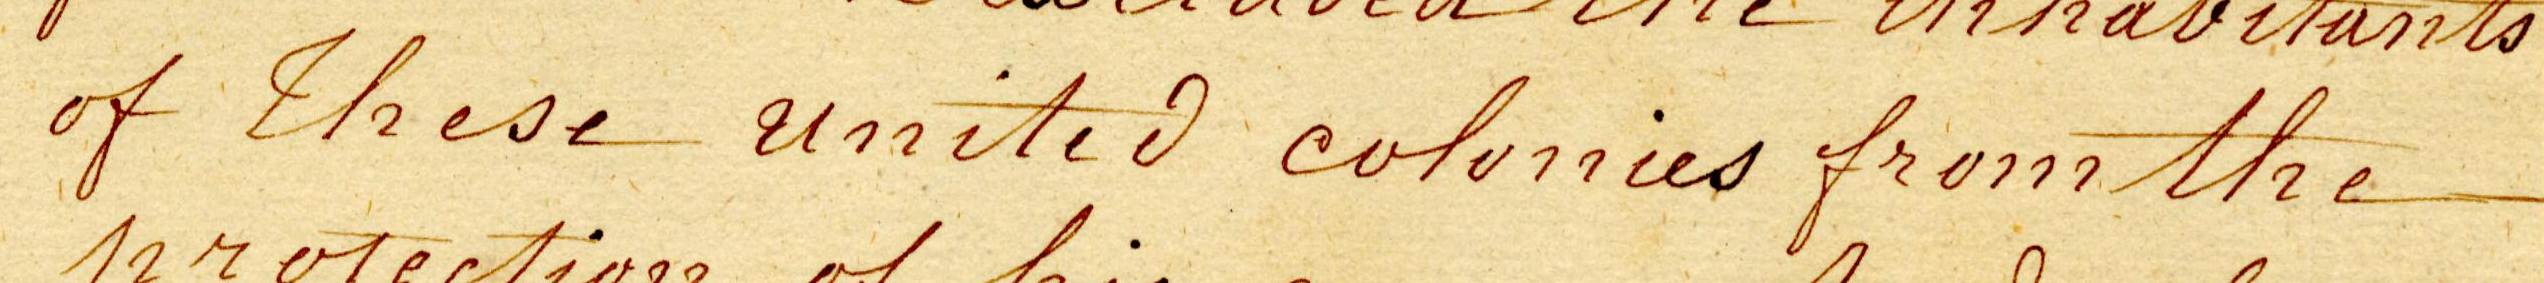of These united colonies from the
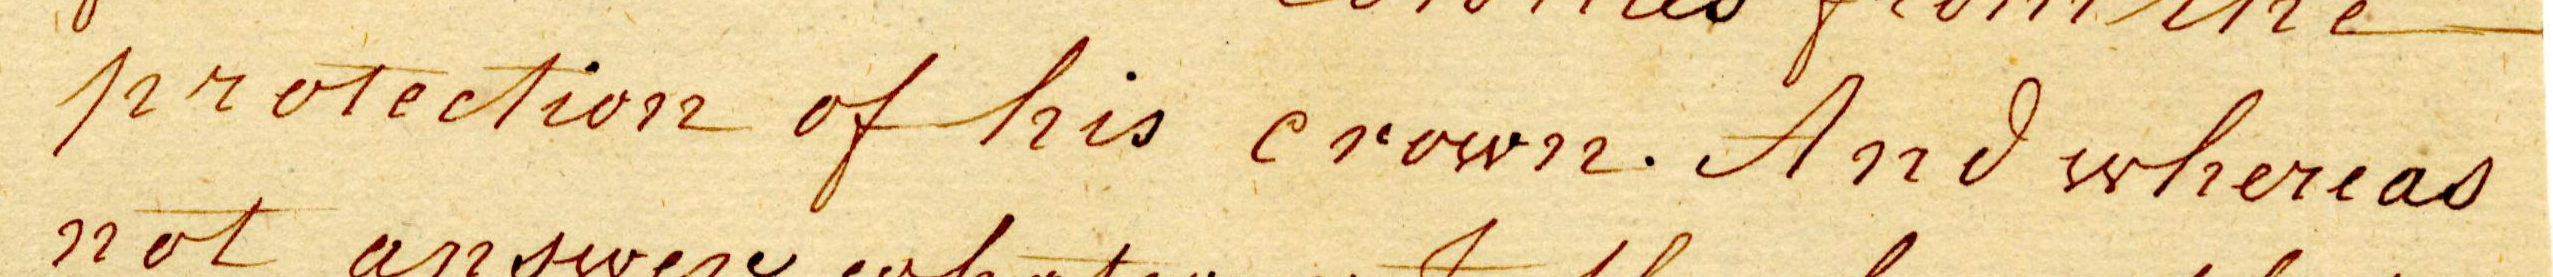protection of his crown. And whereas
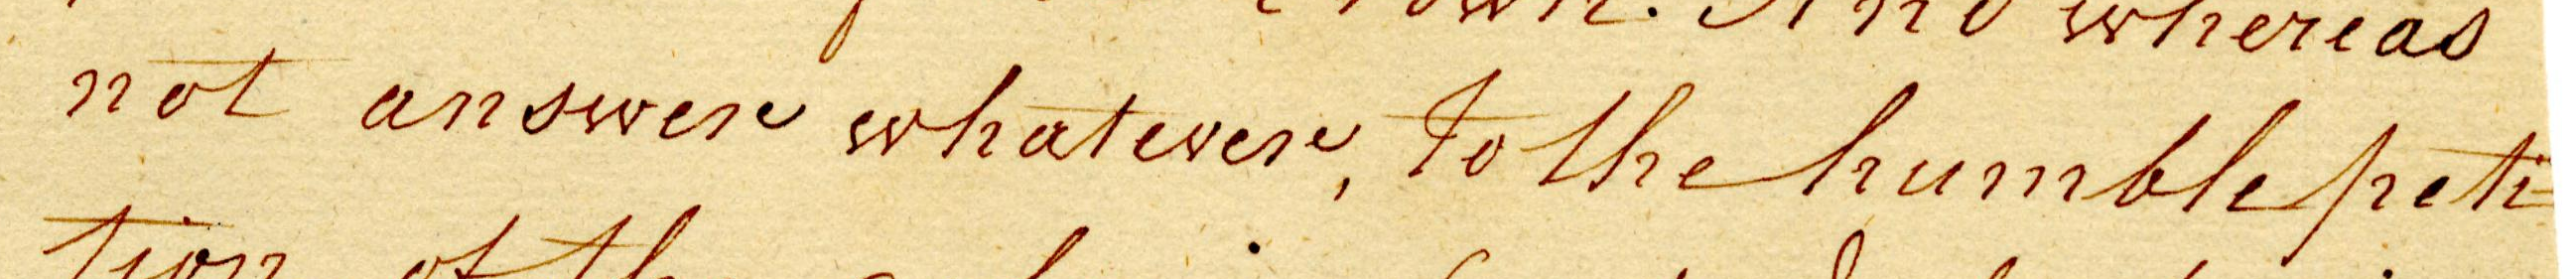not answer whatever, To the humble peti-
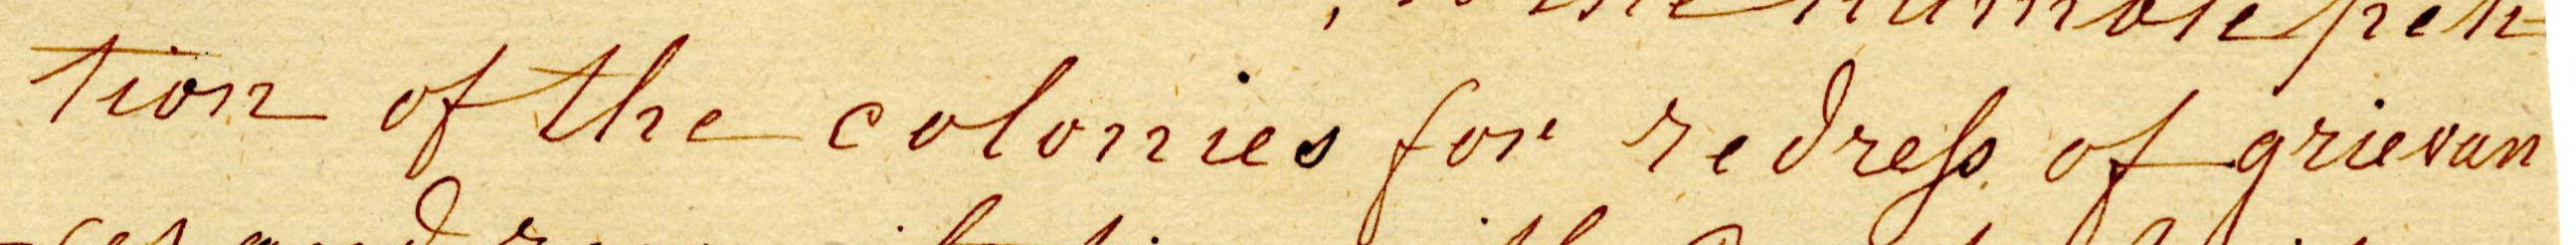tion of the colonies for redress of grievan
